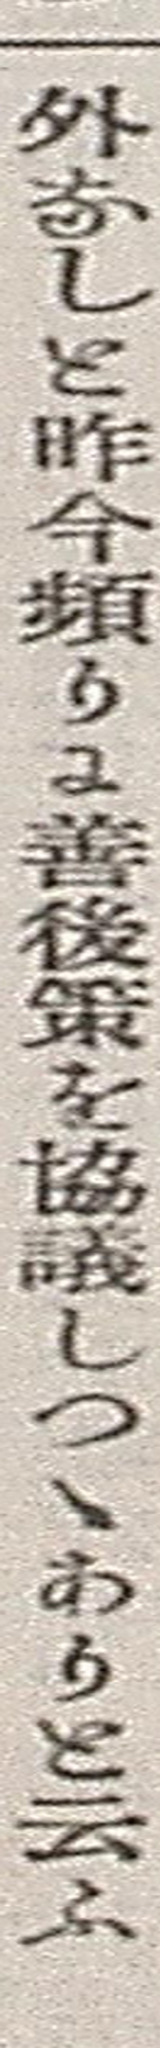外なしと昨今頻りに善後策を協議しつゝありと云ふ
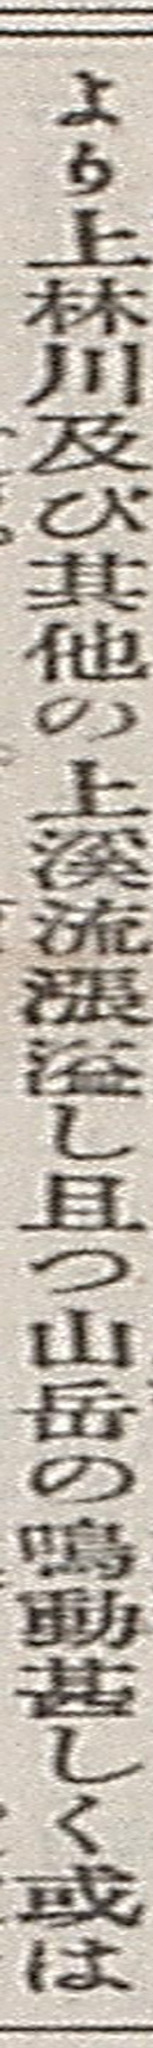より上林川及び其他の上渓流漲溢し且つ山岳の鳴動甚しく或は
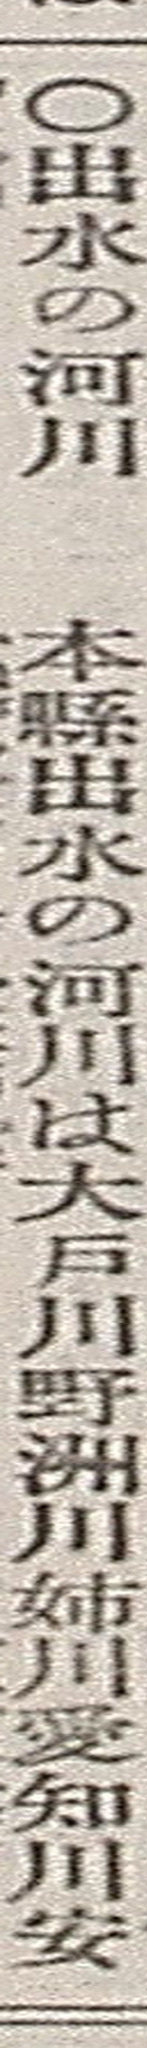◯出水の河川本縣出水の河川は大戸川野洲川姉川愛知川安
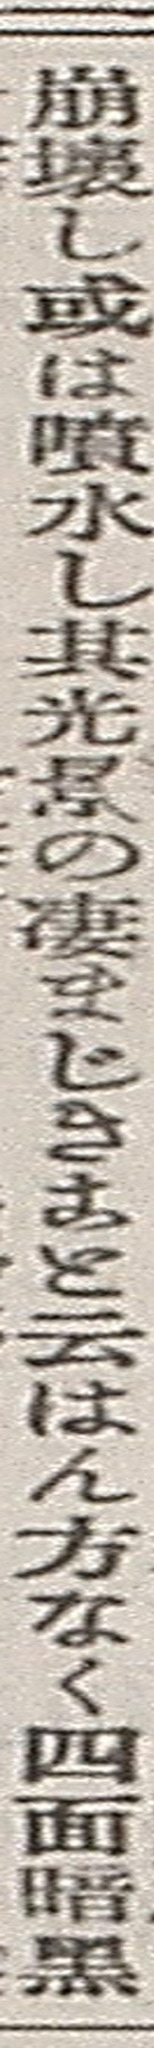崩壊し或は噴水し其光景の凄まじきこと云はん方なく四面暗黒
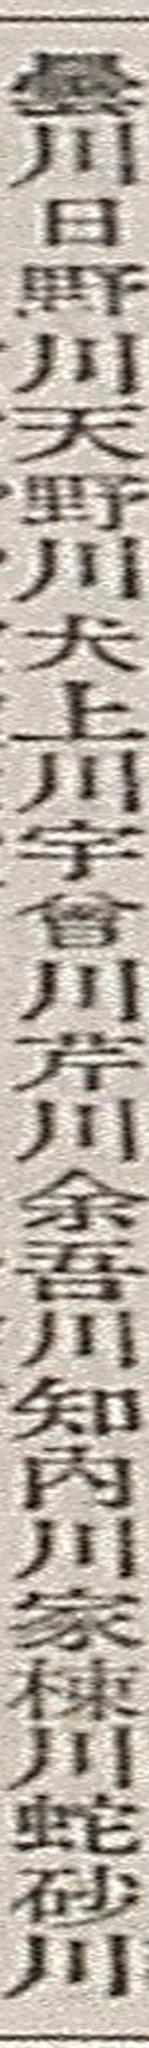曇川日野川天野川犬上川宇曾川芹川余吾川知内川家棟川蛇砂川
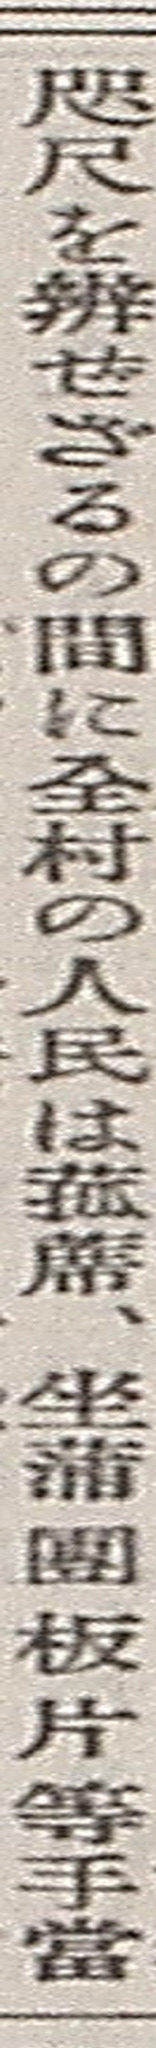咫尺を辨ぜざるの間に全村の人民は菰蓆、坐蒲団板片等手当
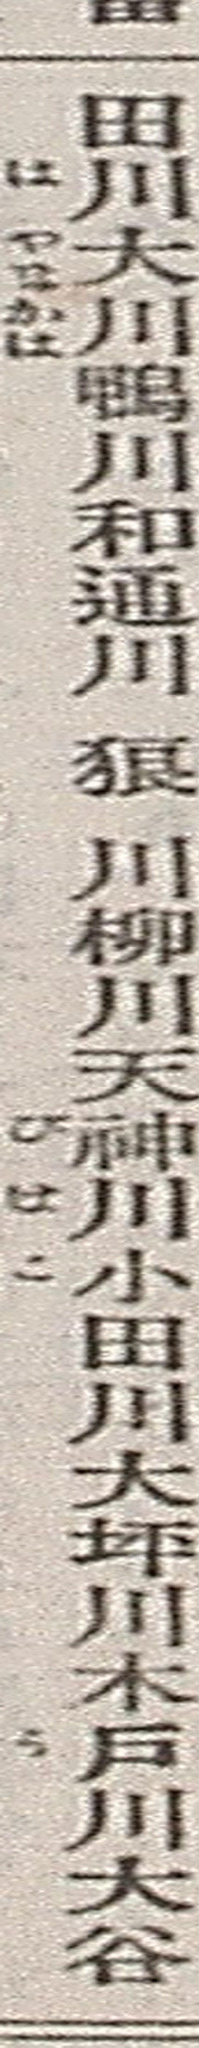田川大川鴨川和通川狼川柳川天神川小田川坪が和木戸が和大谷
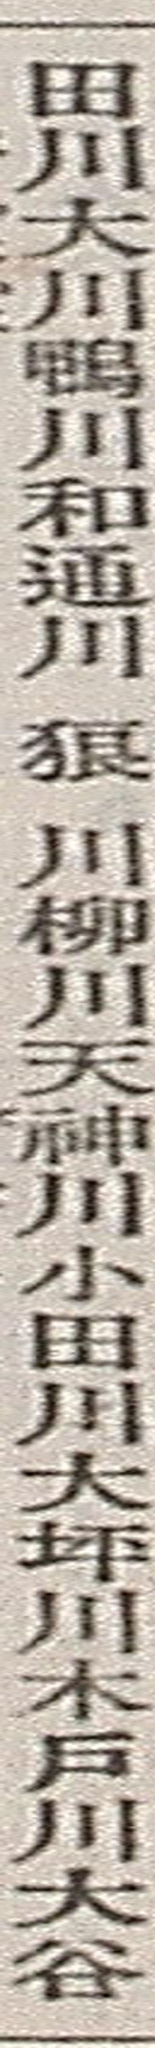田川大川鴨川和通川狼川柳川天神川小田川坪が和木戸が和大谷
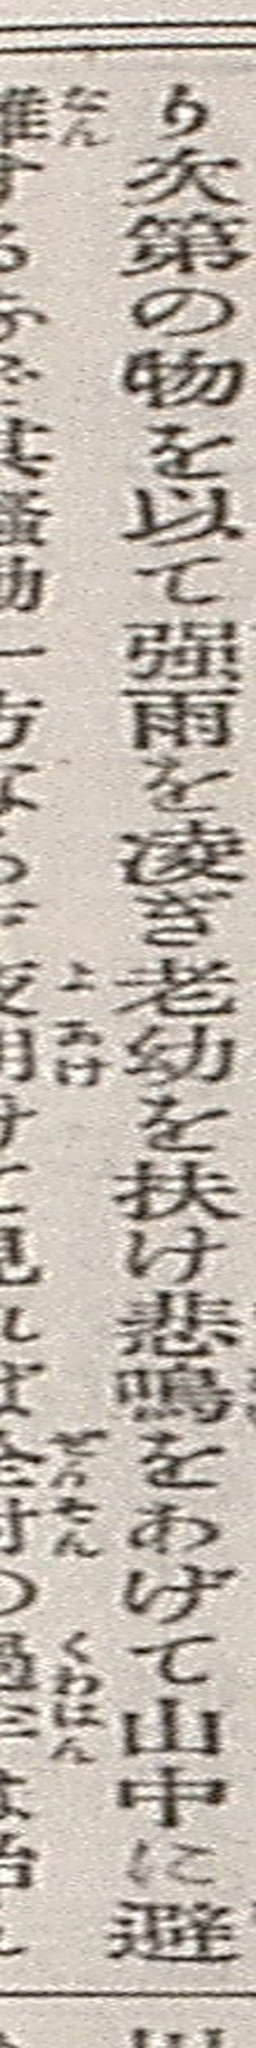難するなど其騒動一方ならず夜明けて見れば全村の過半は殆ど
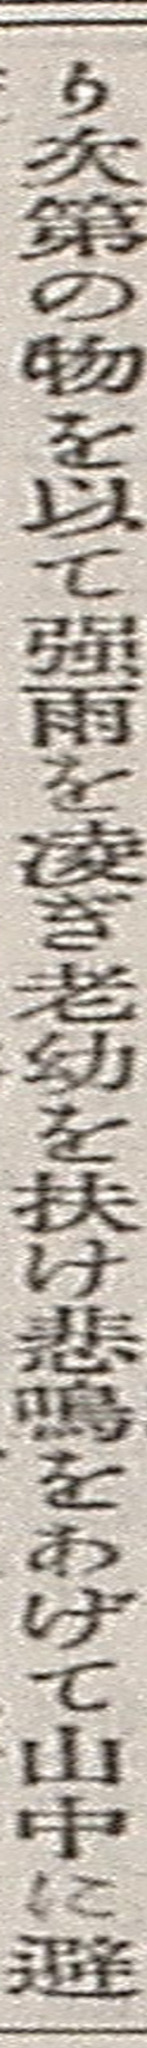り次第の物を以て強雨を凌ぎ老幼を扶け悲鳴をあげて山中に避
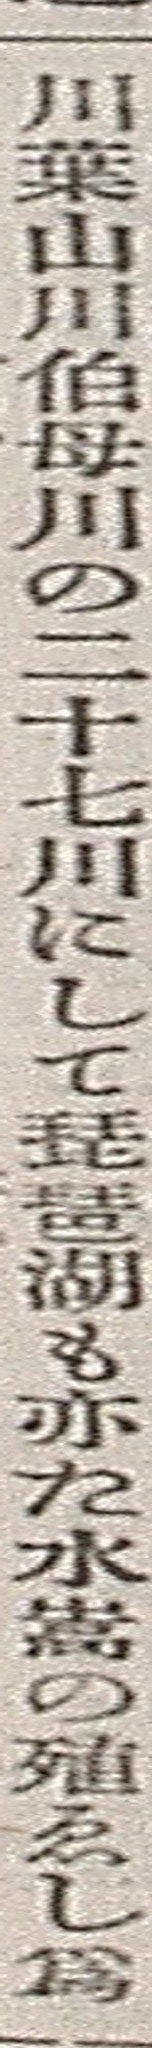川葉山川伯母川の二十七川にして琵琶湖も亦た水嵩の殖ゑし為
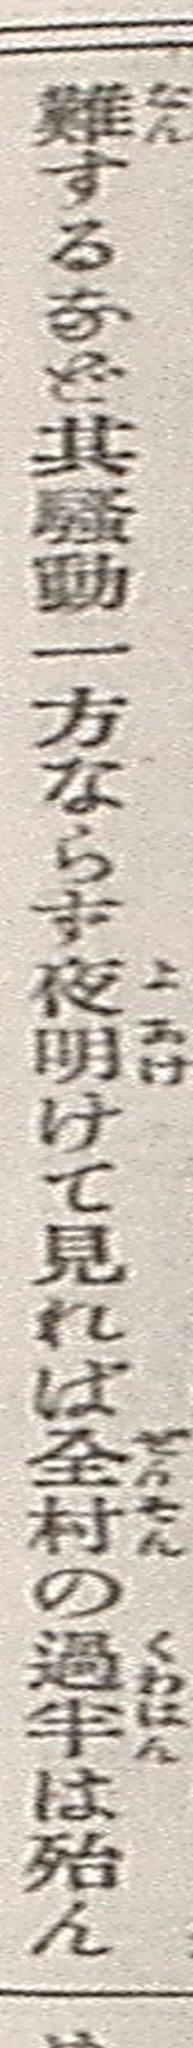難するなど其騒動一方ならず夜明けて見れば全村の過半は殆ど
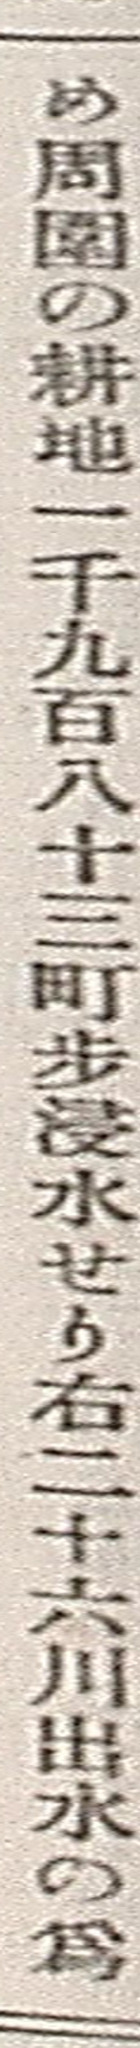め周囲の耕地一千九百八十三町歩浸水せり右二十六川出水の為
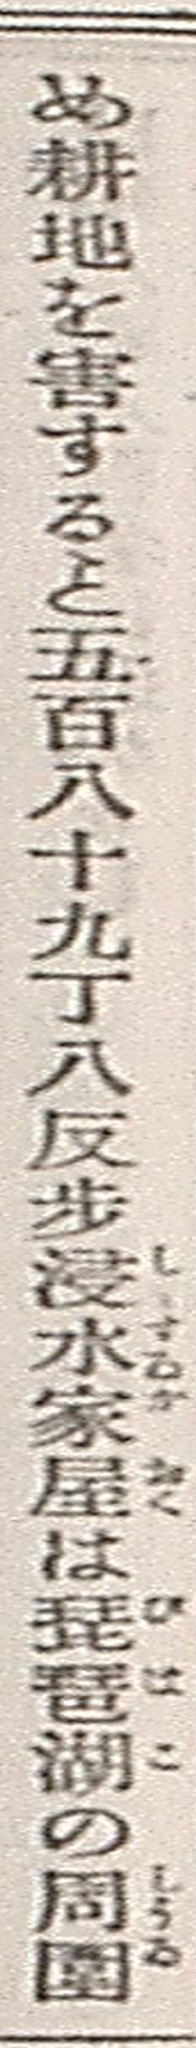め耕地を害すること五百八十九丁八反歩浸水家屋は琵琶湖の周囲
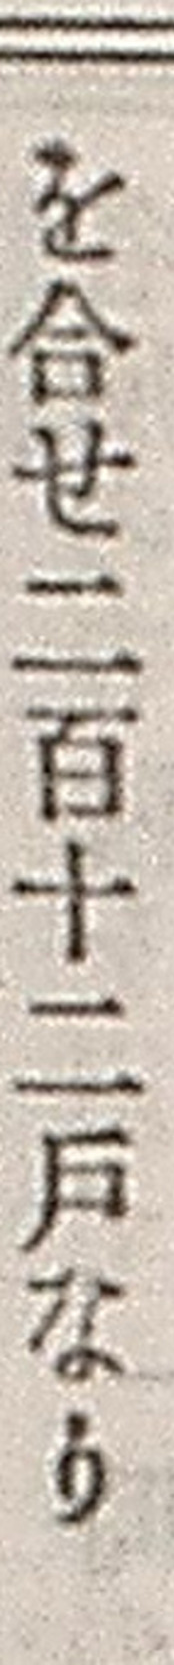を合せ二百十二戸なり
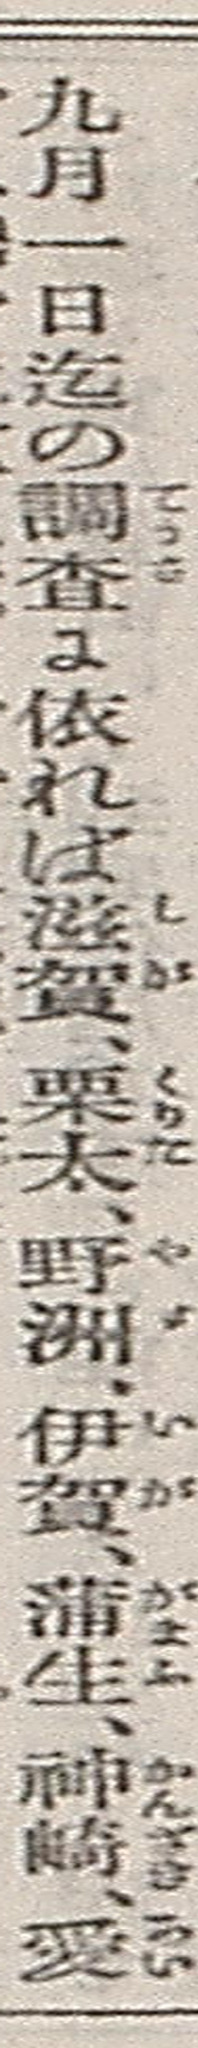九月一日迄の調査に依れば滋賀、栗太、野洲、伊賀、蒲生、神崎、愛
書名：風俗畫報臨時増刊第百二十八號　洪水被害録（下）
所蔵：東京大学地震研究所図書室 Earthquake Research Institute Library, The University of Tokyo, JAPAN
